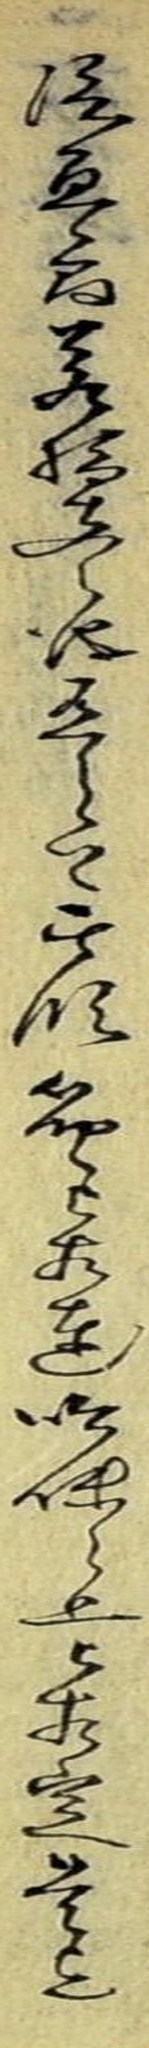渡置候間若指支之儀有之候はヽ其段筋々被相達吟味之上被相定是迄
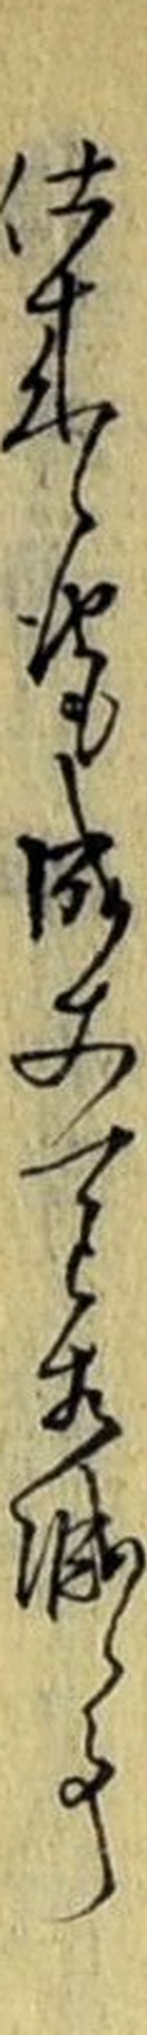仕来候儀も成丈可被相減候事
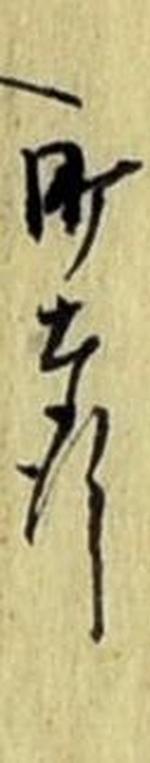町奉行
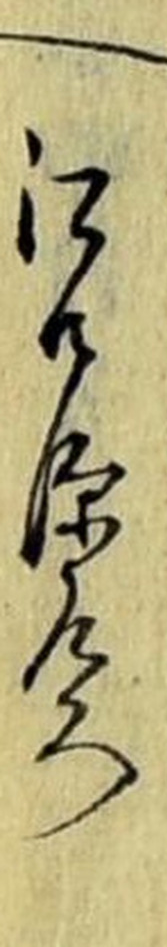江口源左衛門

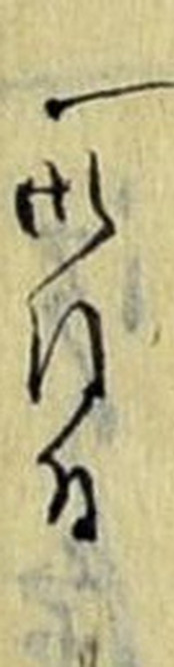御目付
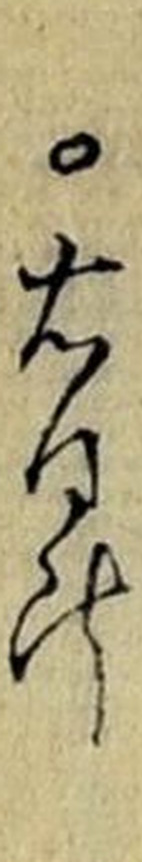○右同断
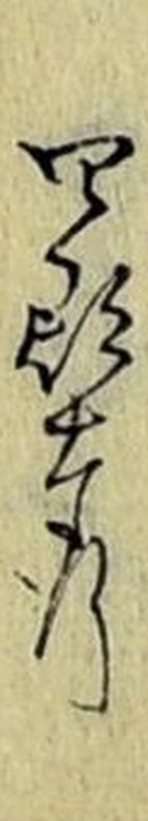四郡奉行
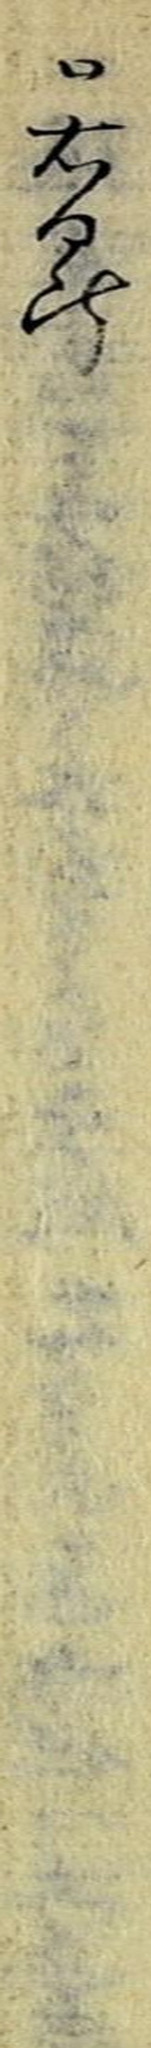○右同断
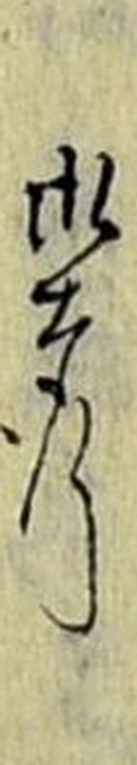御奉行
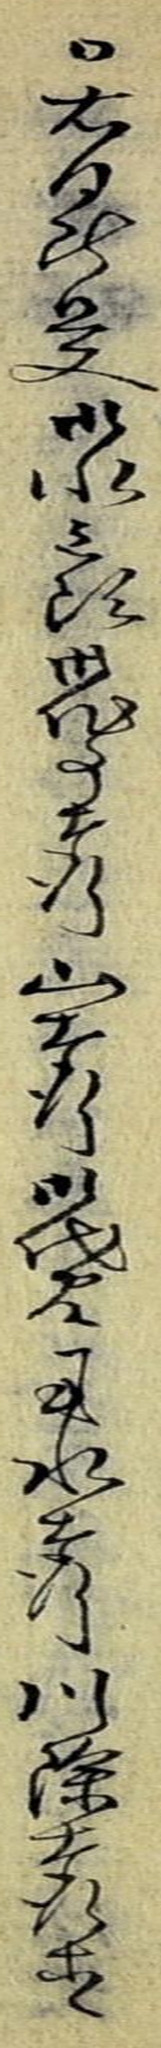○右同断且又御水主頭御作事奉行山奉行御代官用水奉行川除奉行等へ
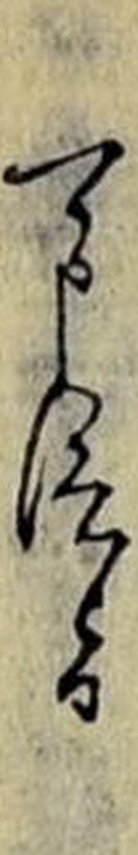可申渡旨
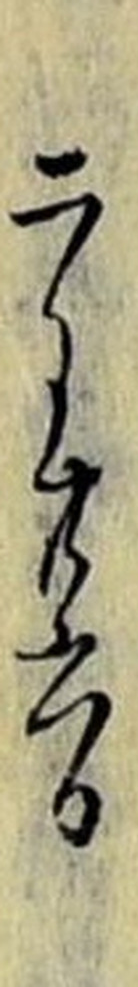二月廿六日
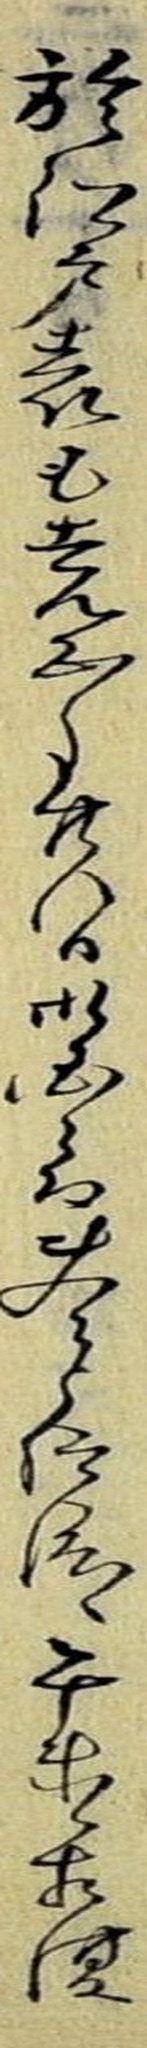於江戸表も去正月廿八日御国に而夫々被仰渡候午未相復
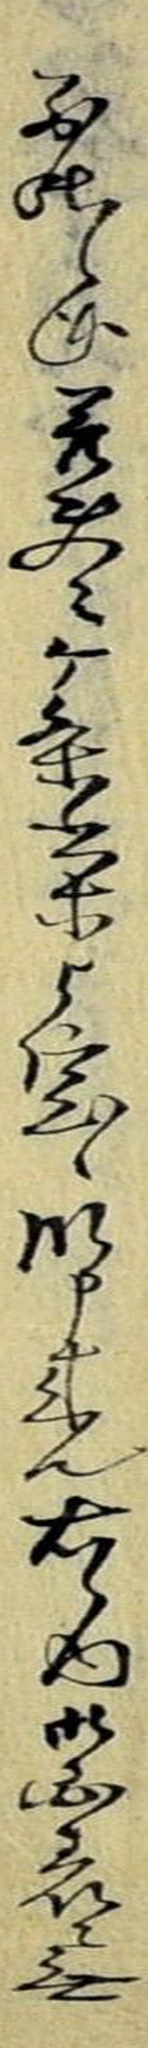別紙之趣并夫々ヶ条書等被仰出候段申来ル右之内御国表に無
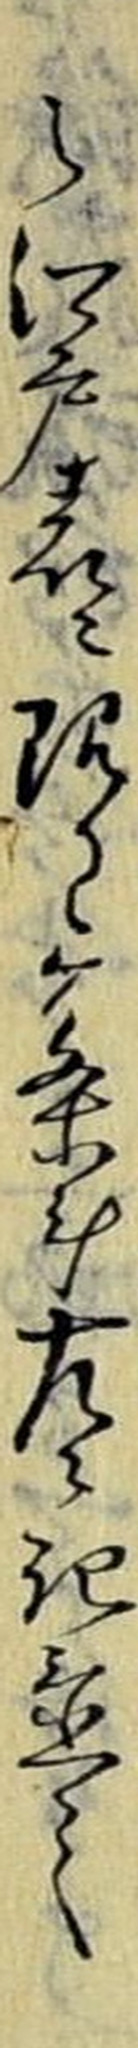之江戸表に限り候ヶ条斗左に記置之
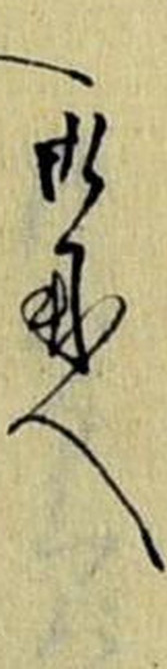御用人
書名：命令之部 四
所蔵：福井県文書館 Fukui Prefectural Archives
